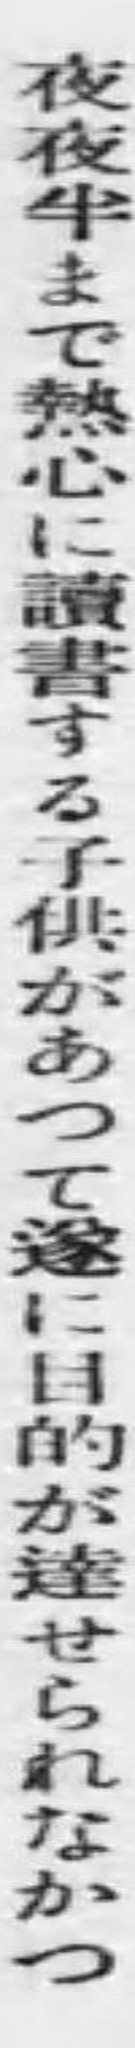夜夜半まで熱心に読書する子供があつて遂に目的が達せられなかつ
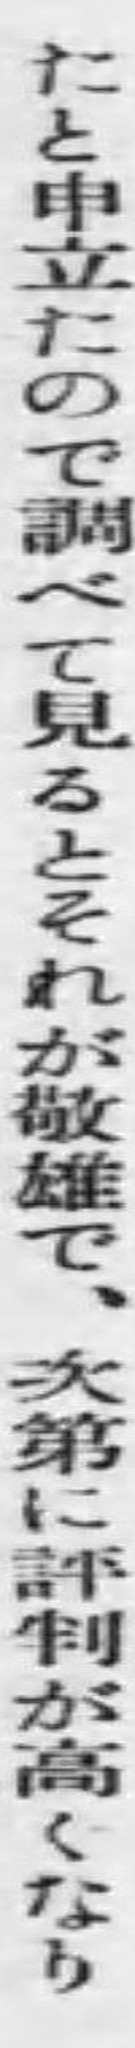たと申立たので調べて見るとそれが敬雄で、次第に評判が高くなり
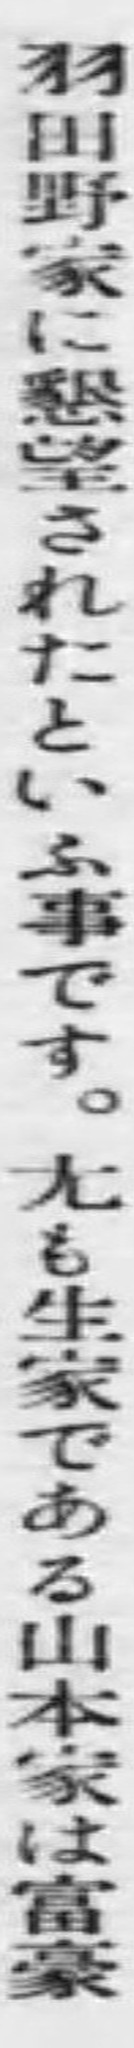羽田野家に懇望されたといふ事です。尤も生家である山本家は富豪
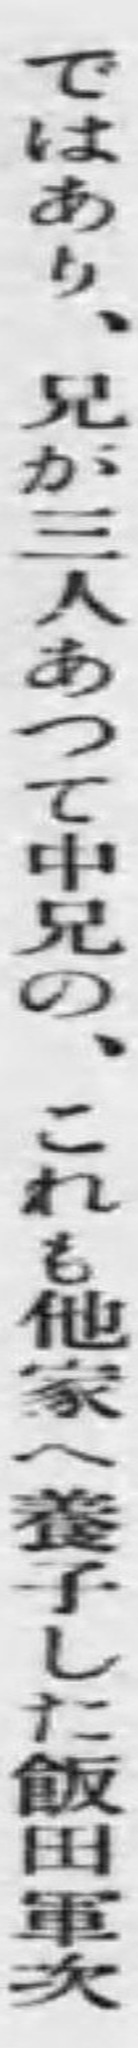ではあり、兄が三人あつて中兄の、これも他家へ養子した飯田軍次
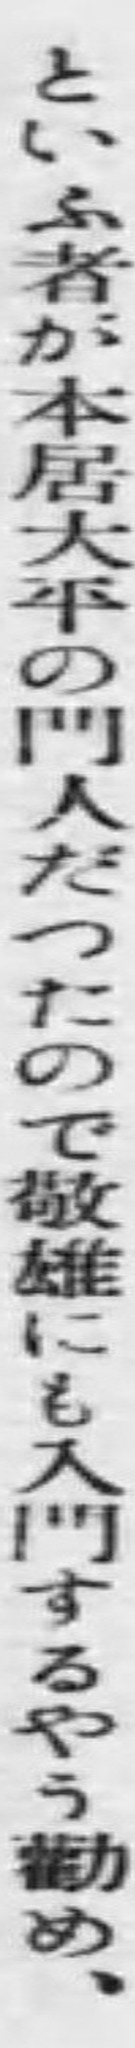といふ者が本居大平の門人だつたので敬雄にも入門するやう勧め、
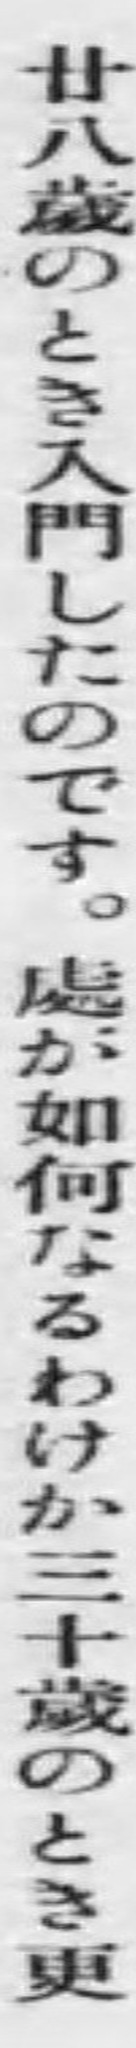廿八歳のとき入門したのです。処が如何なるわけか三十歳のとき更
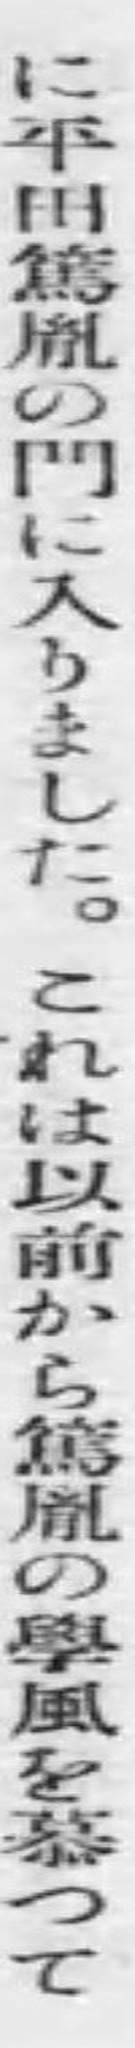に平田篤胤の門に入りました。これは以前から篤胤の学風を慕つて
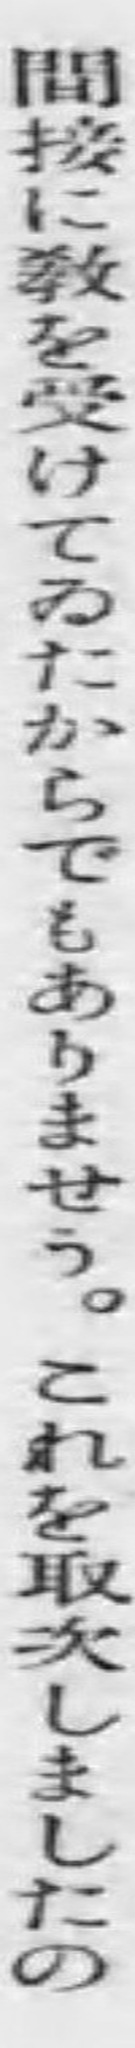間接に教を受けてゐたからでもありませう。これを取次しましたの
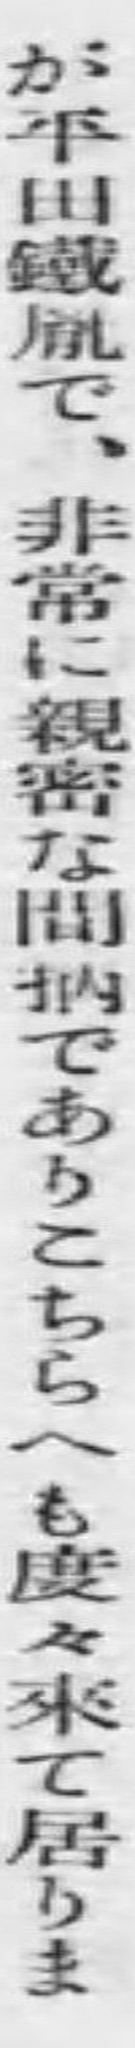が平田鉄胤で、非常に親密な間抦でありこちらへも度々来て居りま
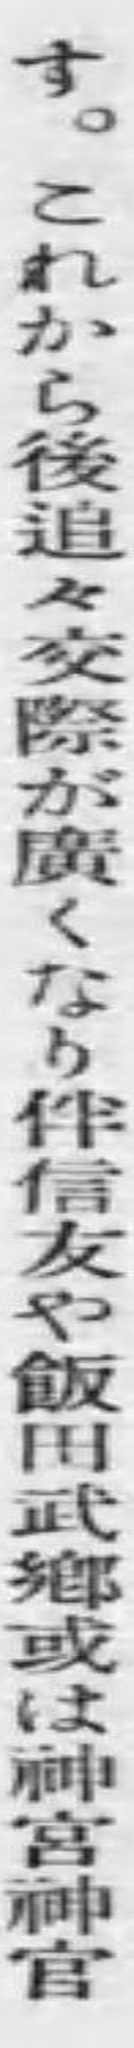す。これから後追々交際が広くなり伴信友や飯田武郷或は神宮神官
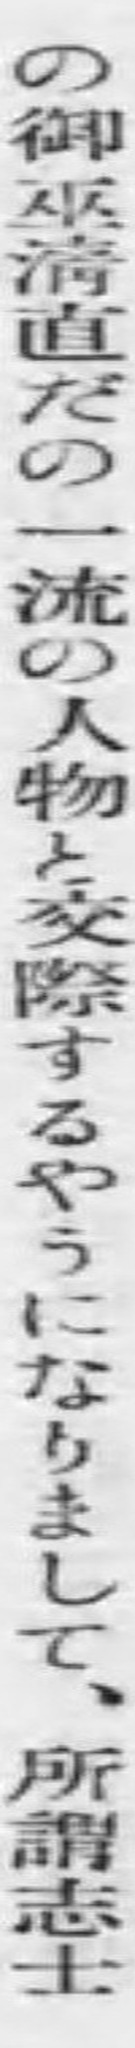の御巫清直だの一流の人物と交際するやうになりまして、所謂志士
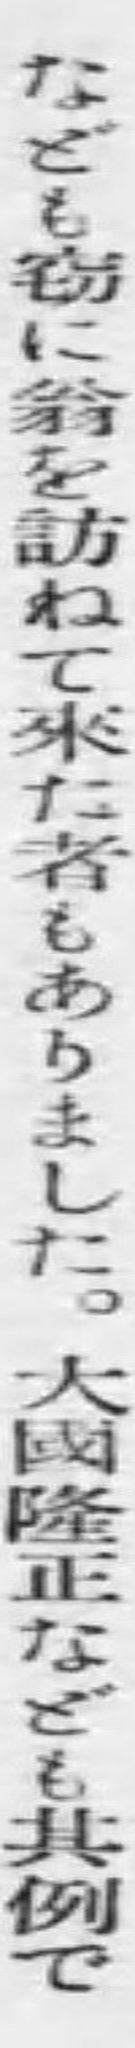なども窃に翁を訪ねて来た者もありました。大国隆正なども其例で
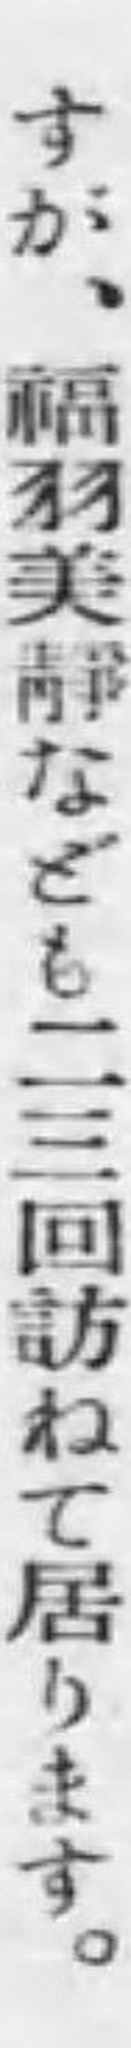すが、福羽美静なども二三回訪ねて居ります。
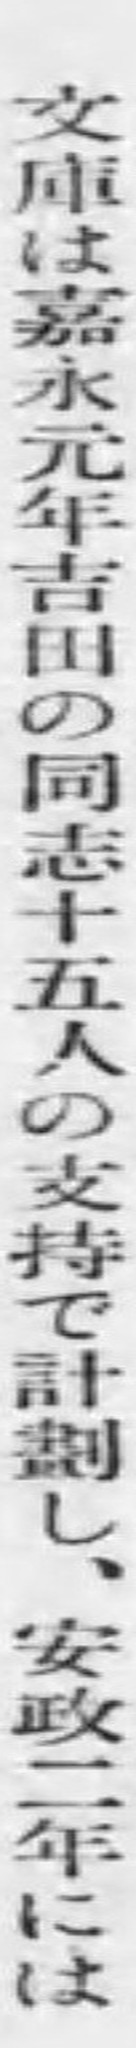文庫は嘉永元年吉田の同志十五人の支持で計画し、安政二年には
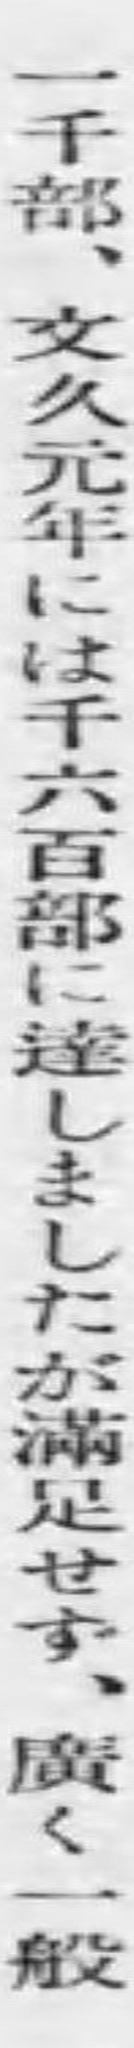一千部、文久元年には千六百部に達しましたが満足せず、広く一般
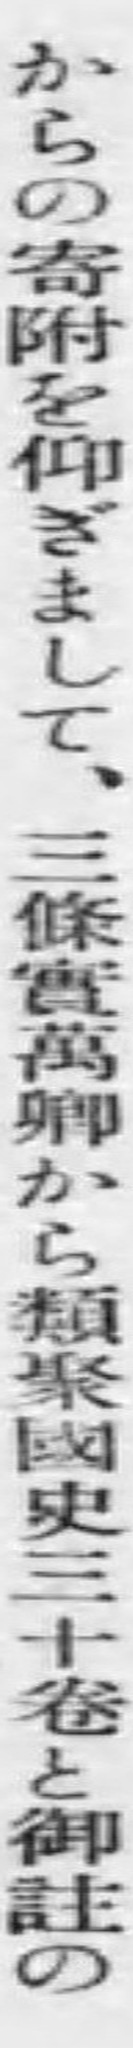からの寄附を仰ぎまして、三条実万卿から類聚国史三十巻と御註の
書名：東三河道中記 : 豊橋市及其附近案内
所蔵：国立国会図書館 National Diet Library, JAPAN
